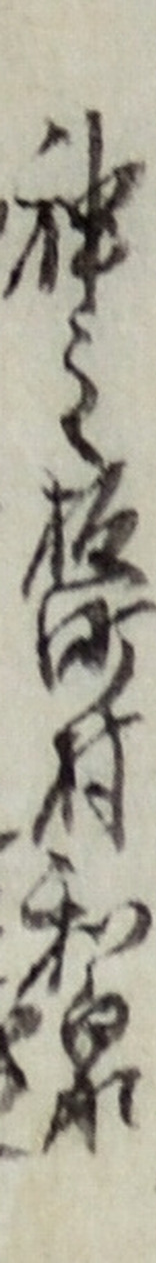神主板町村和泉
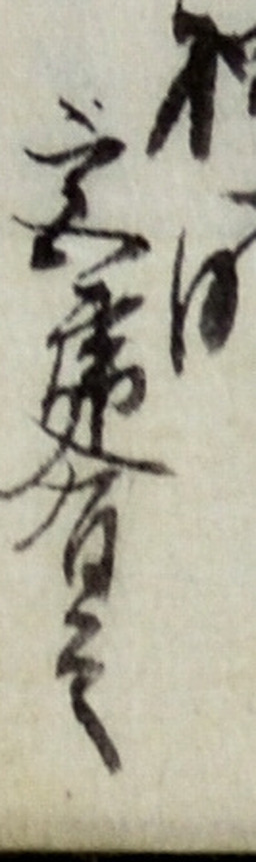宮建有之
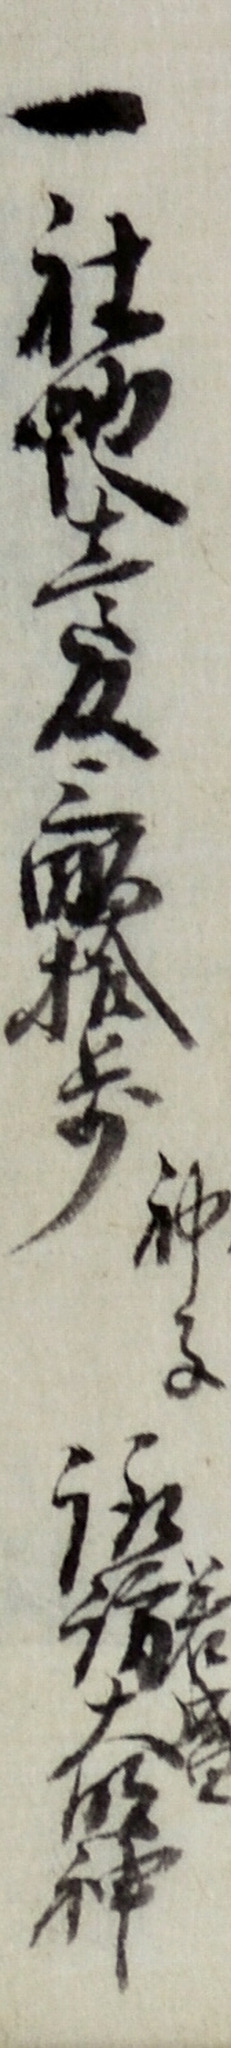一社地壱反三畝拾歩諏訪大明神

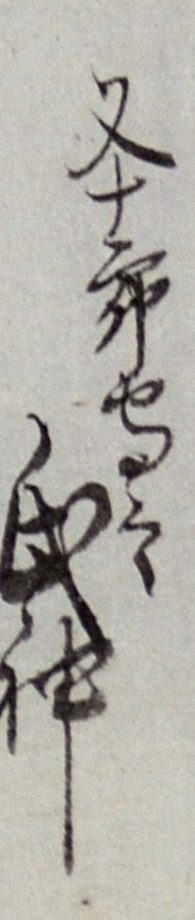又十郎守之
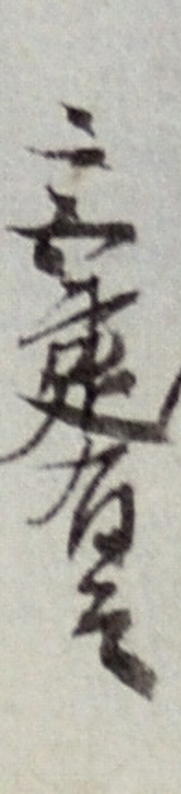宮建有之
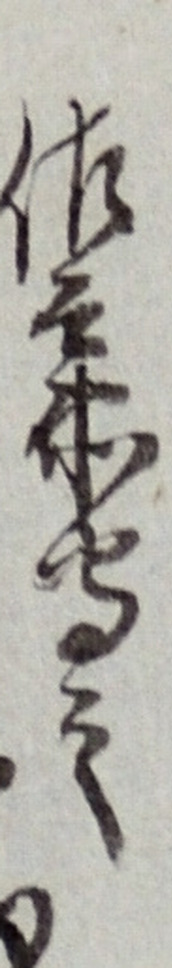佐兵衛守之
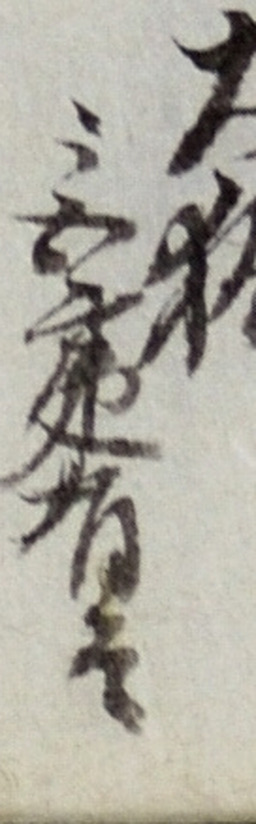宮建有之
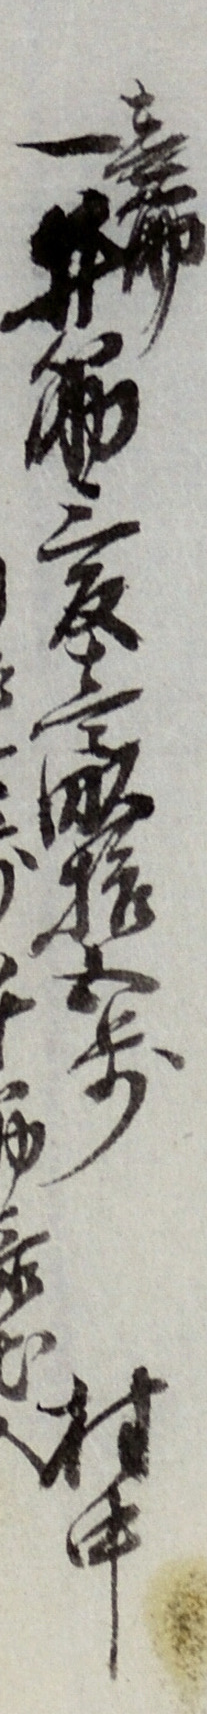一井筋三反壱畝拾五歩村中
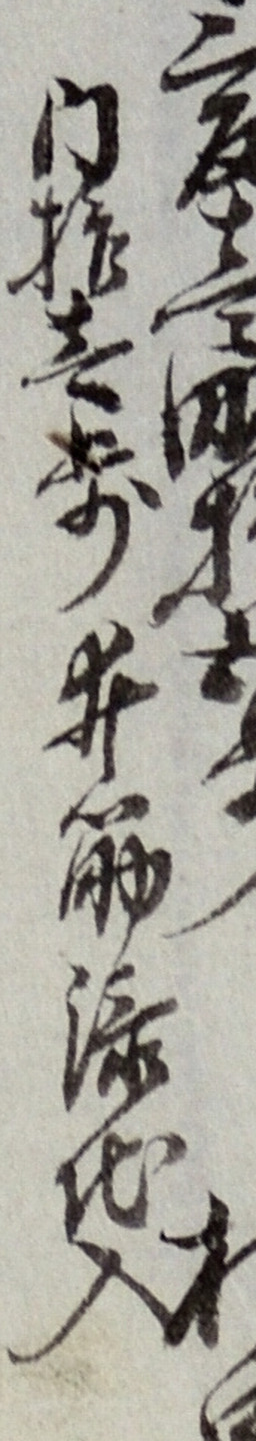内拾壱歩井筋添地入
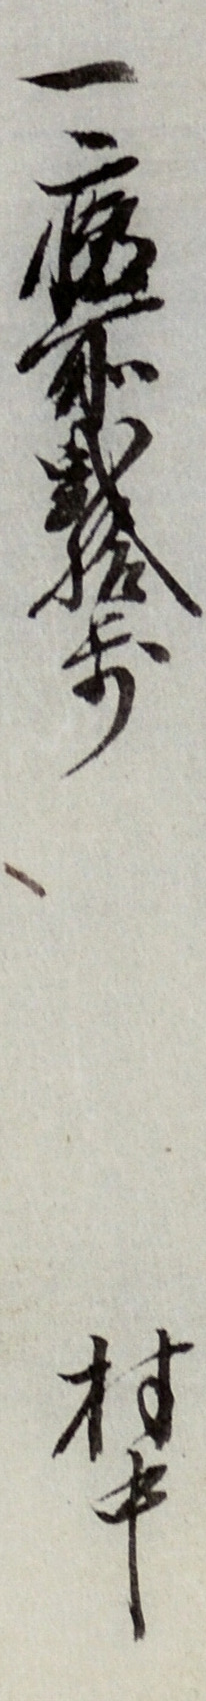一廟所弐拾歩村中
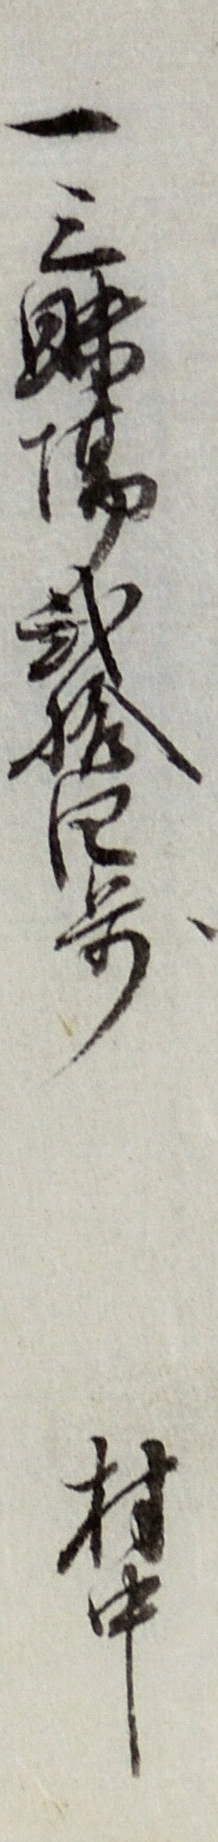一三昧場弐拾四歩村中
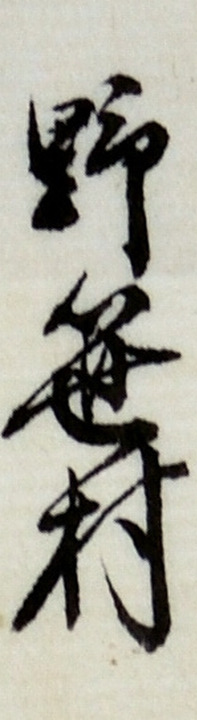野笹村
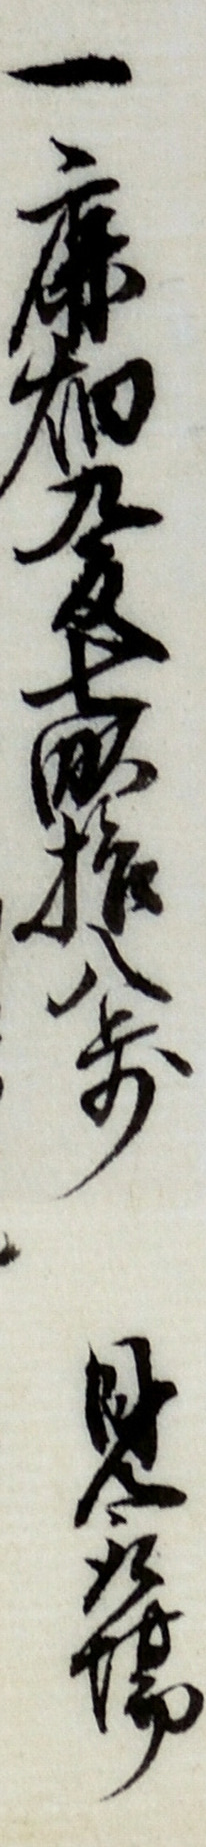一麻畑九反七畝拾八歩見取場
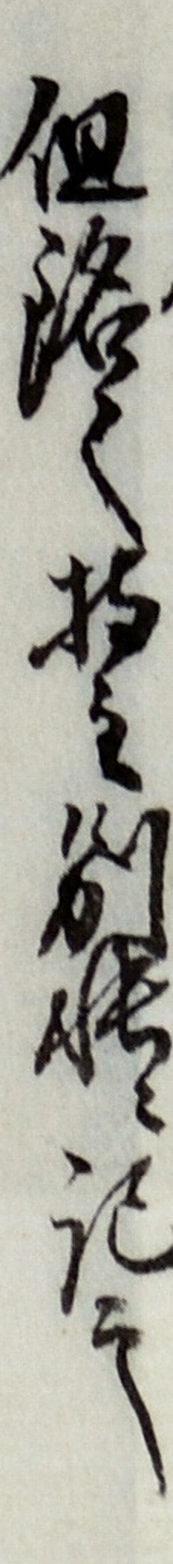但銘々持主別帳ニ記之
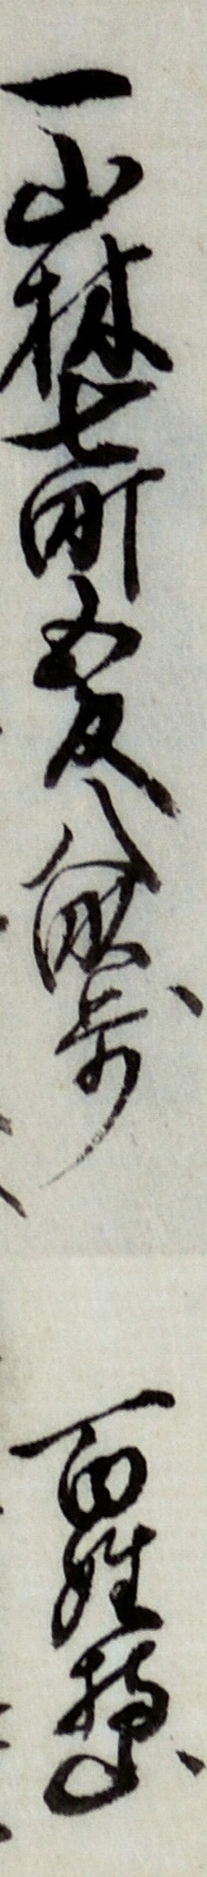一山林七町五反八畝歩百姓持山
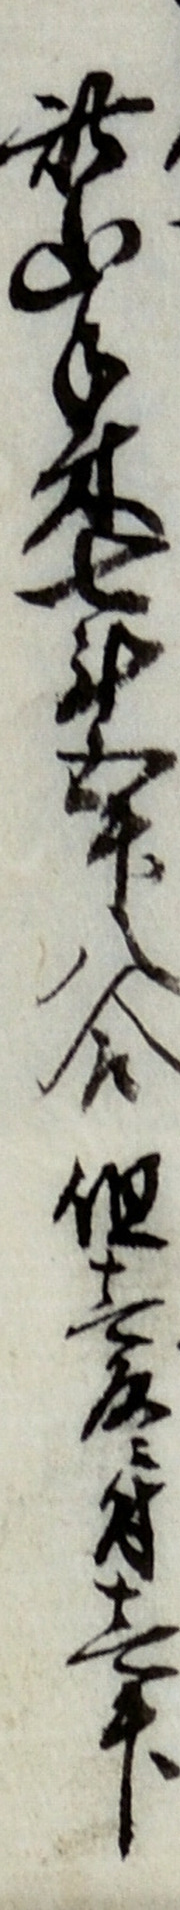此山手米七斗五升八合但壱反ニ付壱升
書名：御領分中山林社地手控
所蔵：伊那市立高遠町図書館・合同会社AMANE
